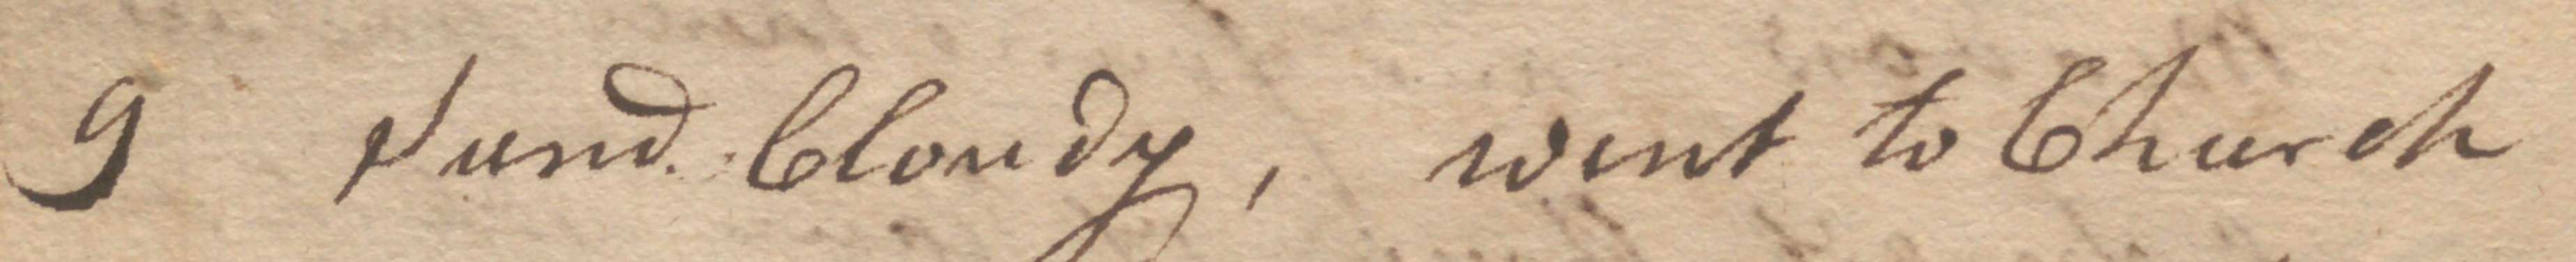9 Sund. Cloudy, went to Church
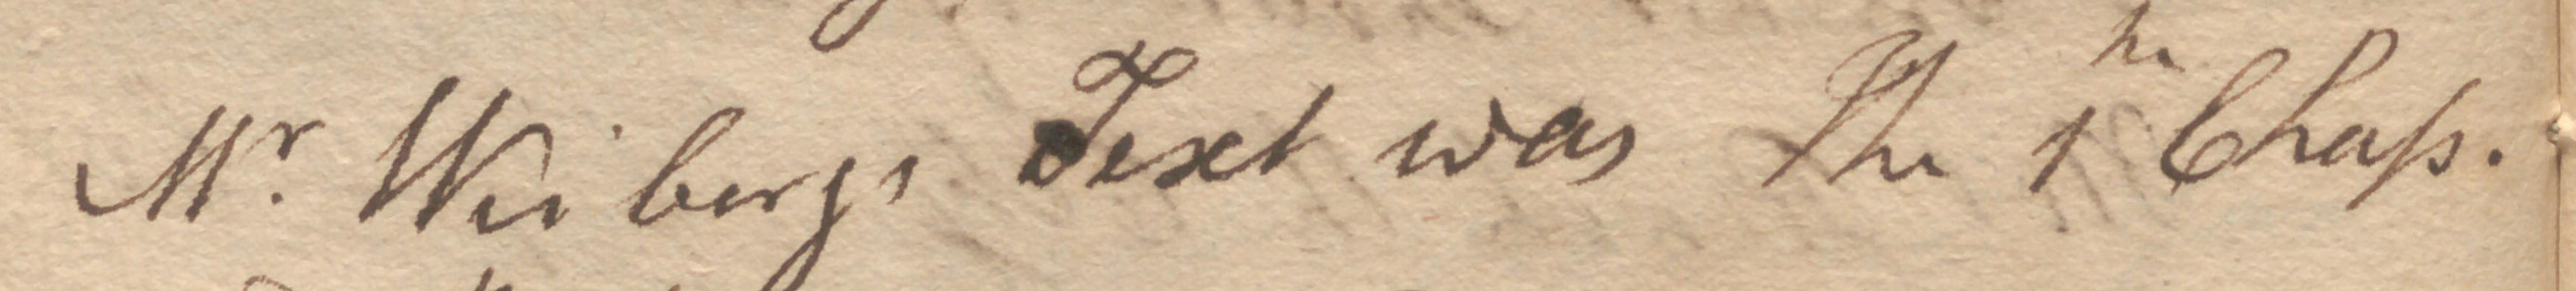M^r. Weibergs Text was The 1^th Chap.
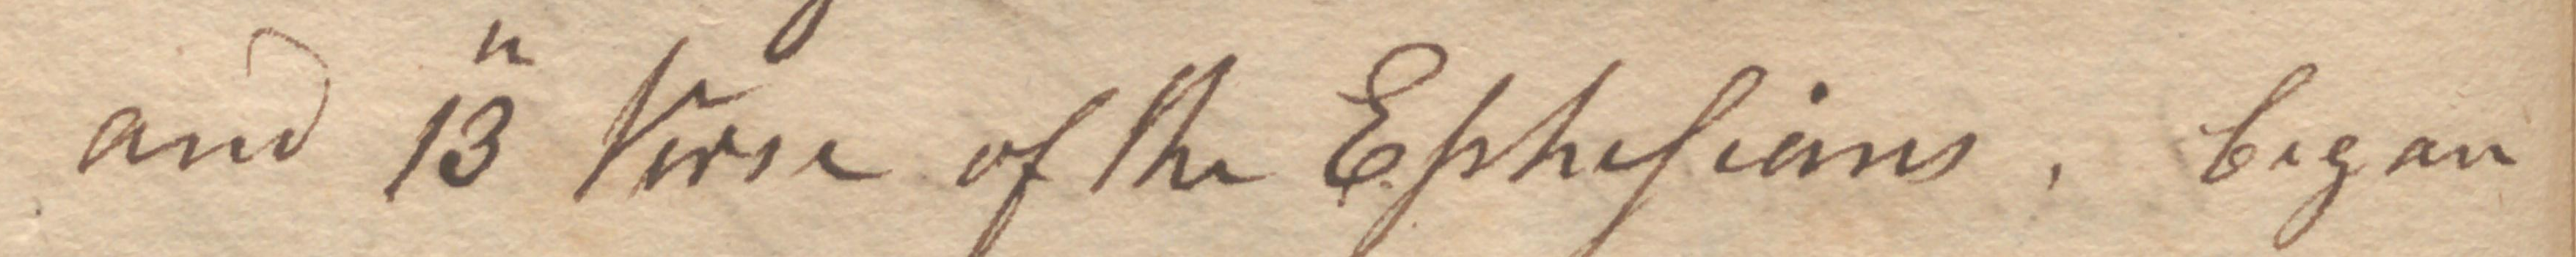and 13^th Verse of the Ephesians, began
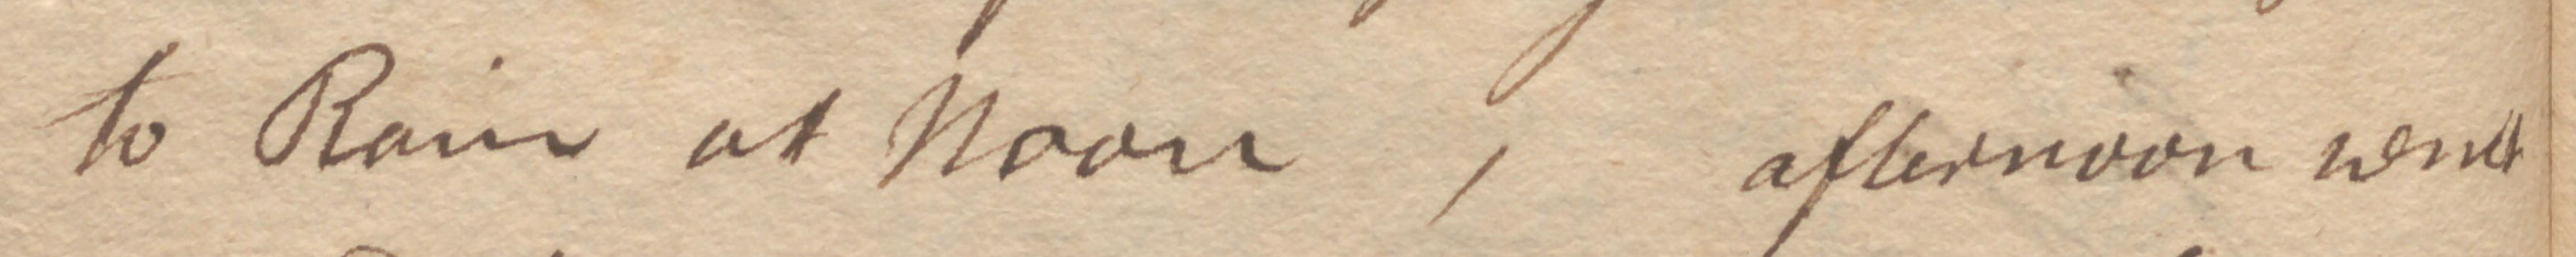to Rain at Noon, afternoon went
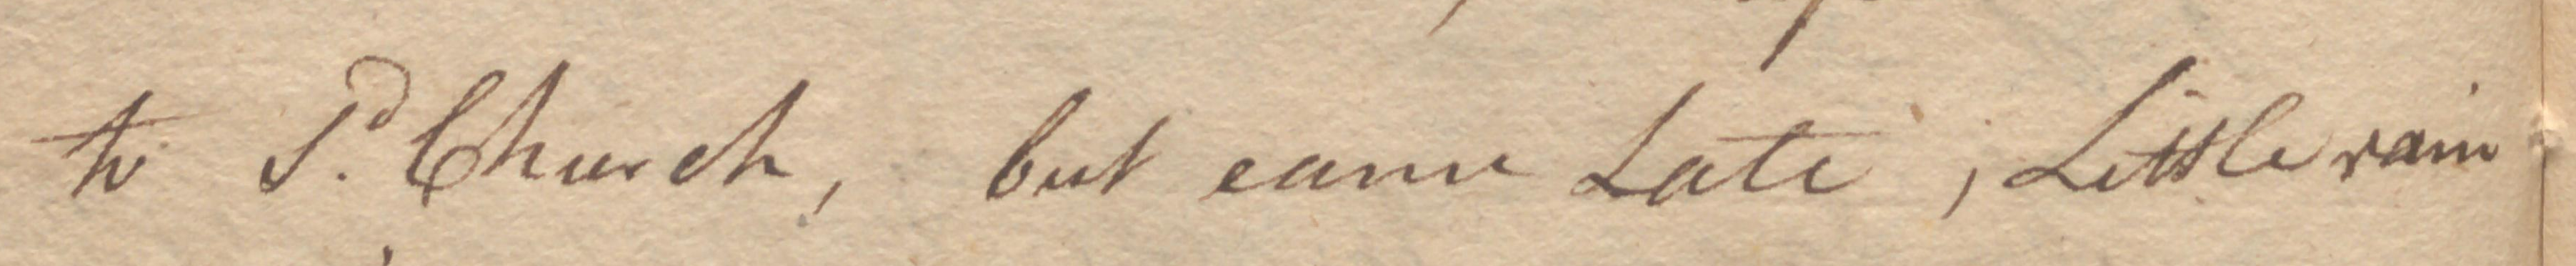to s^d. Church, but came Late, Little rain
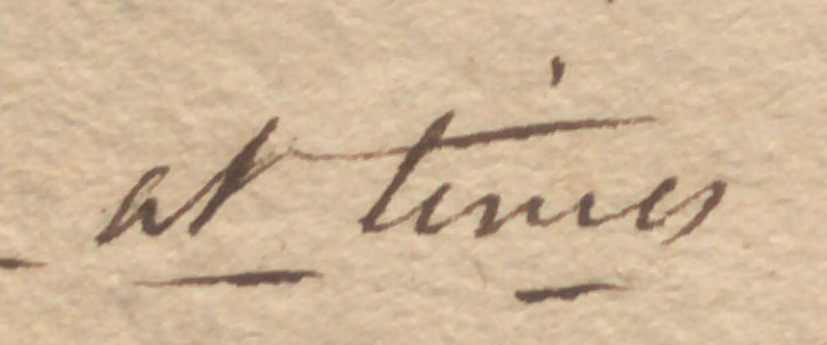at times
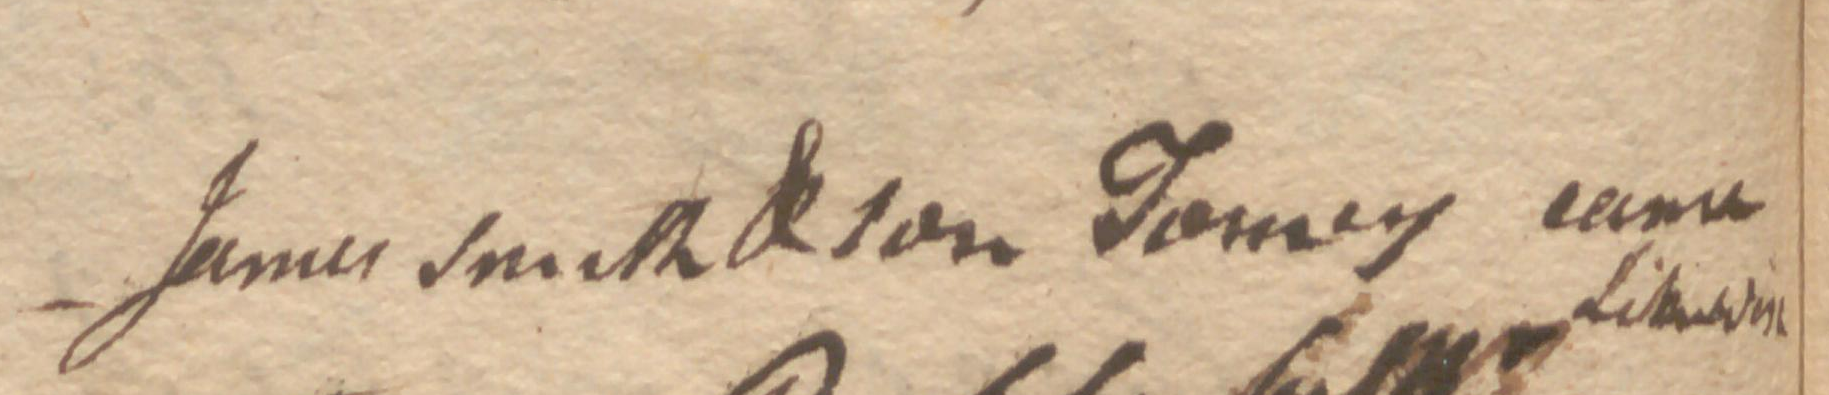James smith & son Tomey came
